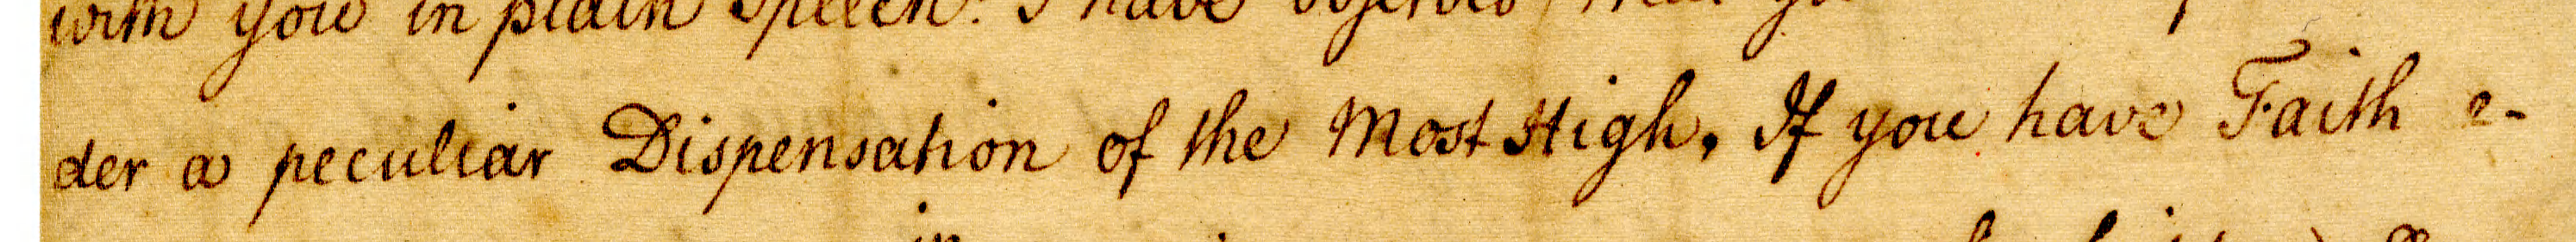der a peculiar Dispensation of the Most High, If you have Faith e-
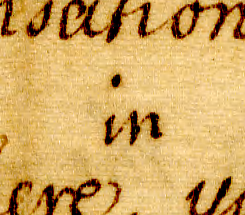in
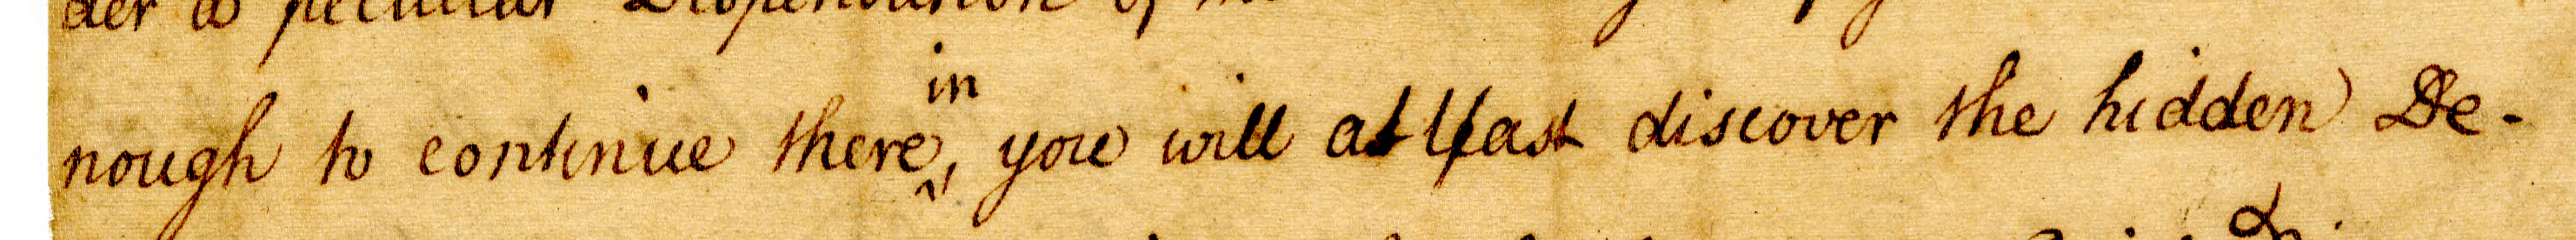nough to continue there ^ you will at last discover the hidden De-
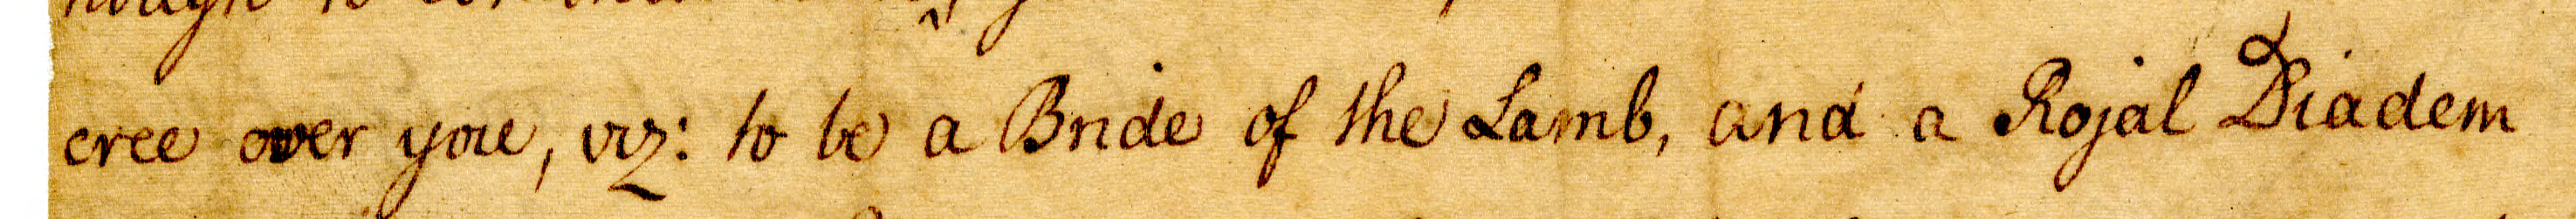cree over you, viz: to be a Bride of the Lamb, and a Royal Diadem
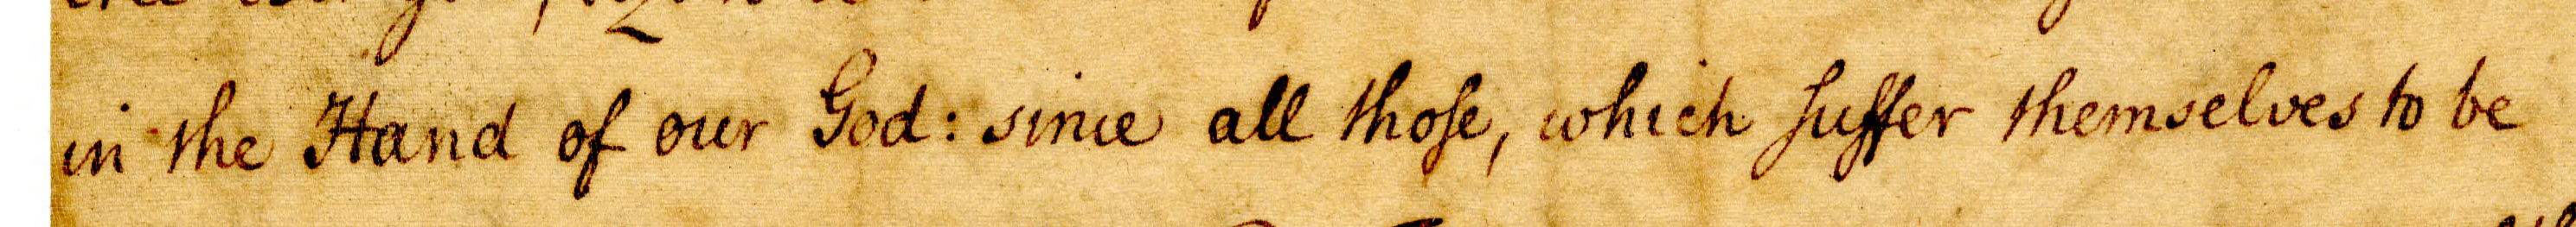in the Hand of our God: since all those, which suffer themselves to be
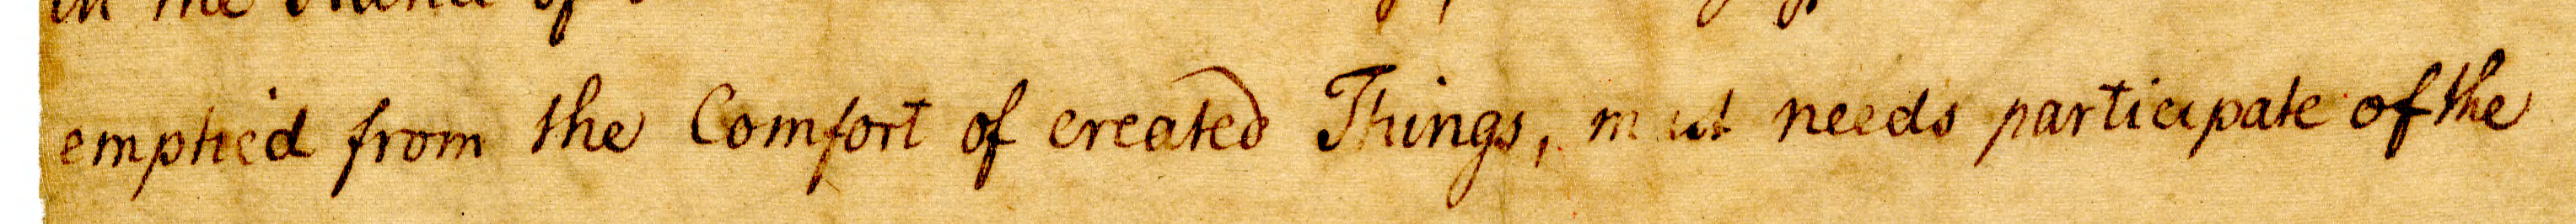emptied from the comfort of created Things, must needs participate of the
